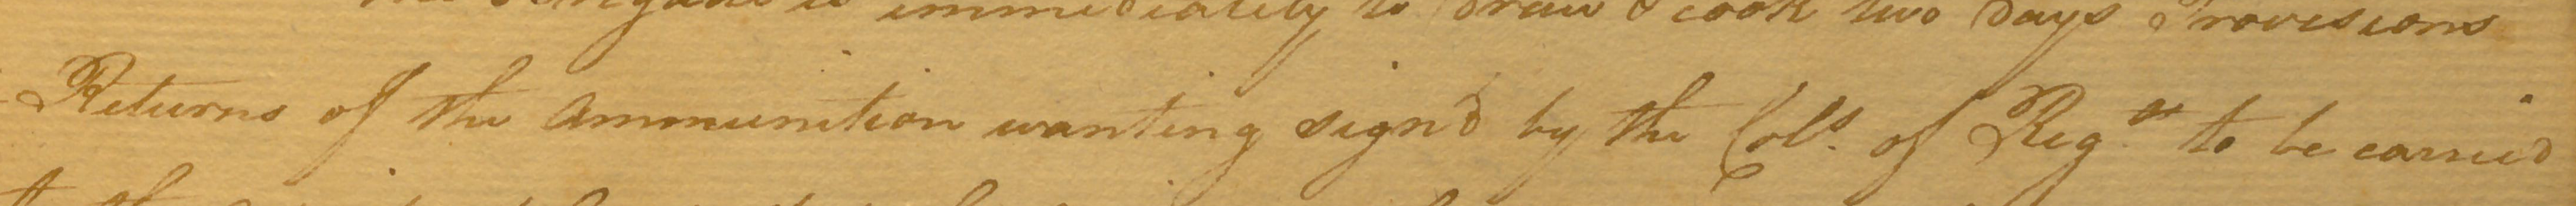Returns of the Ammunition wanting sign'd by the Col^s. of Reg^ts. to be carried
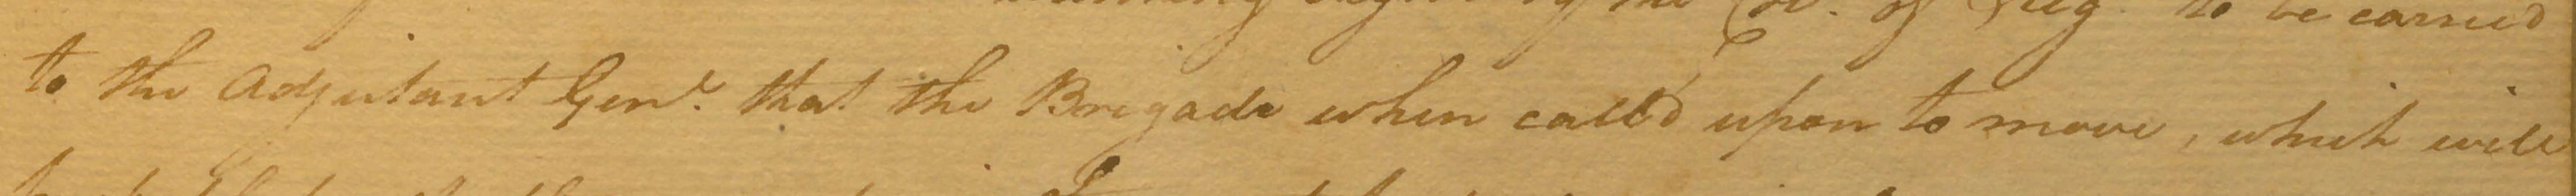to the Assistant Gen^l. that the Brigade when call'd upon to move, which will
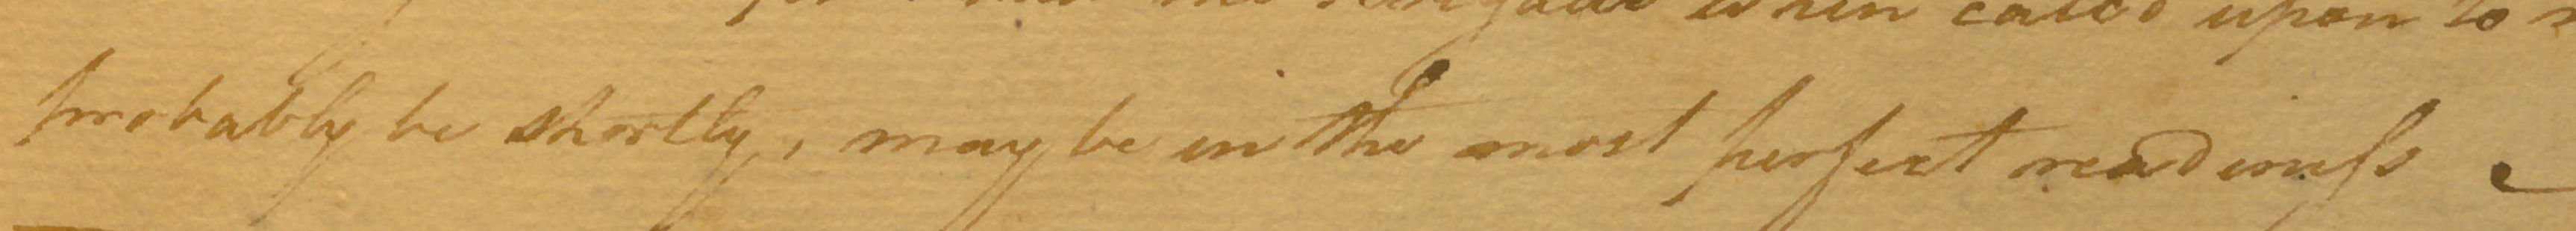probably be shortly, may be in the most perfect readiness.
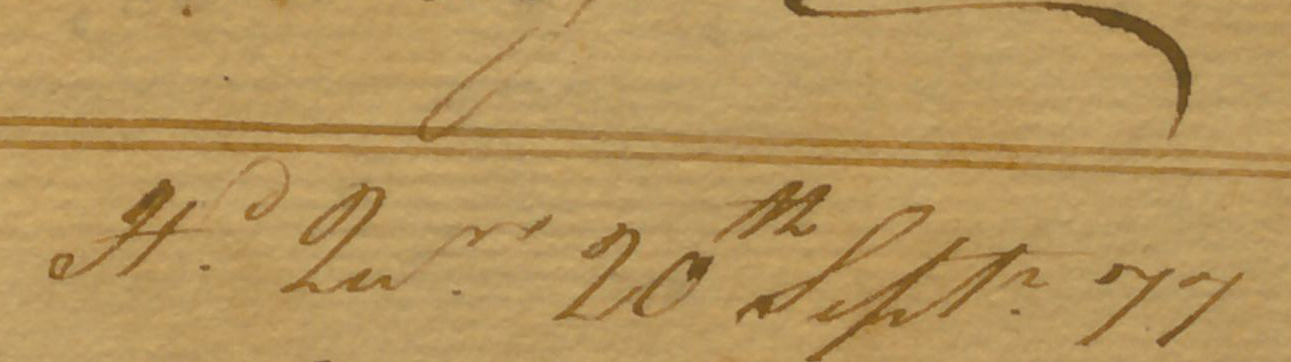H^d. Qu^rs. 20^th Sept^r. 77
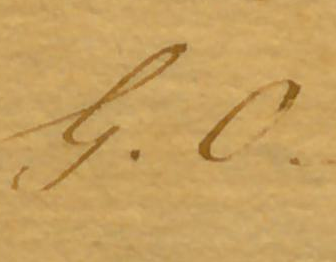G.O.
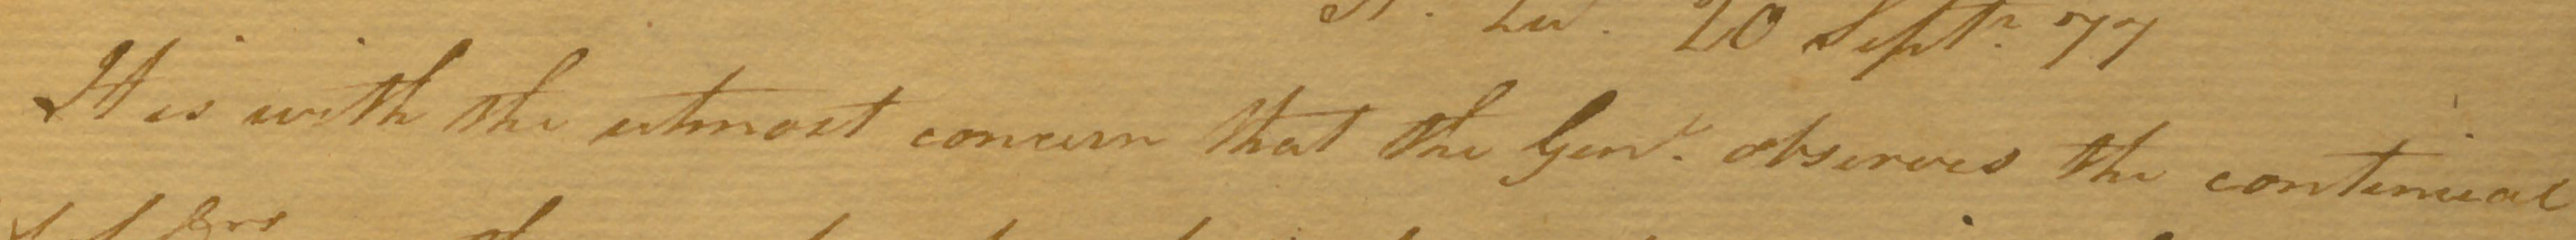It is with the utmost concern that the Gen^l. observes the continual
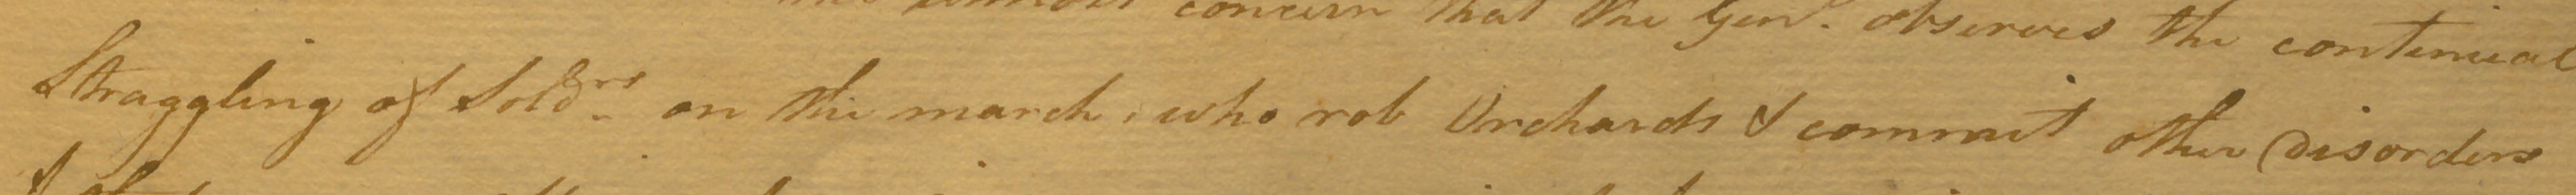Straggling of Sold^rs. on the march who rob Orchards & commit other disorders
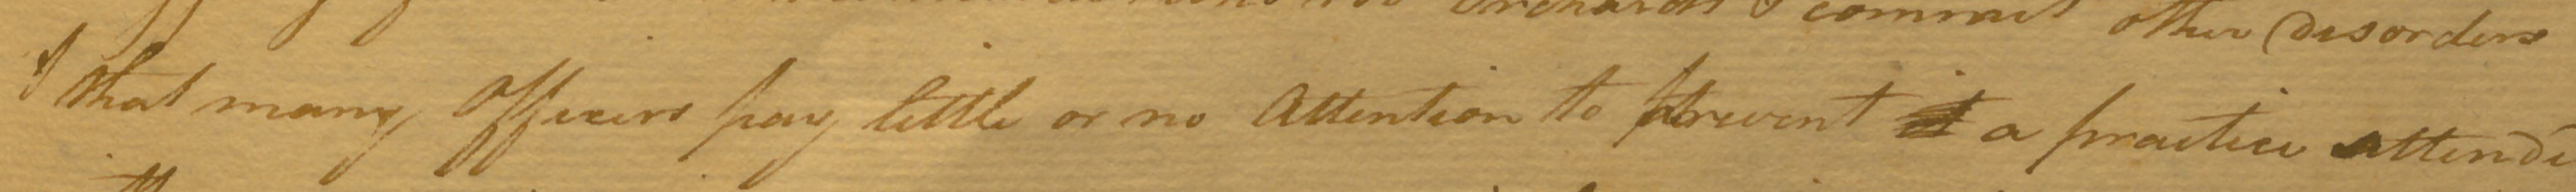& that many Officers pay little or no Attention to prevent [__] a practice attended
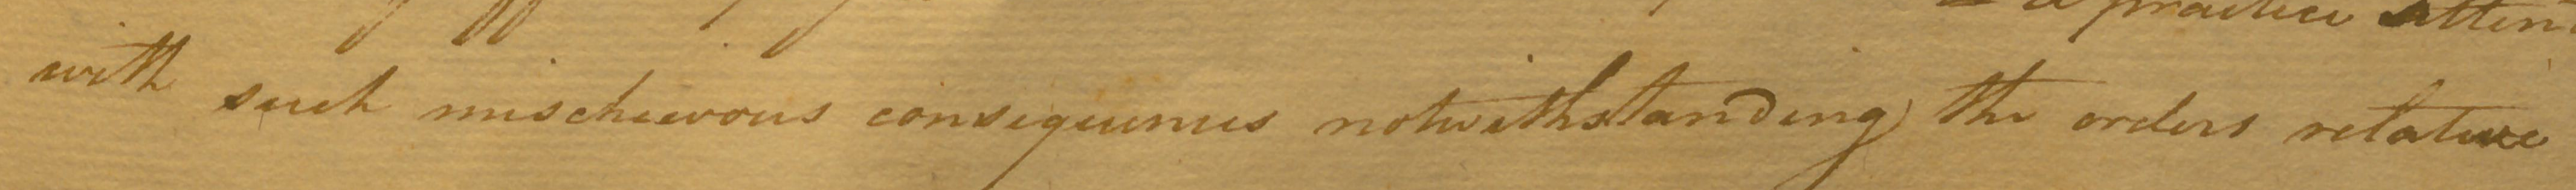with such mischievous consequences notwithstanding the orders relative
